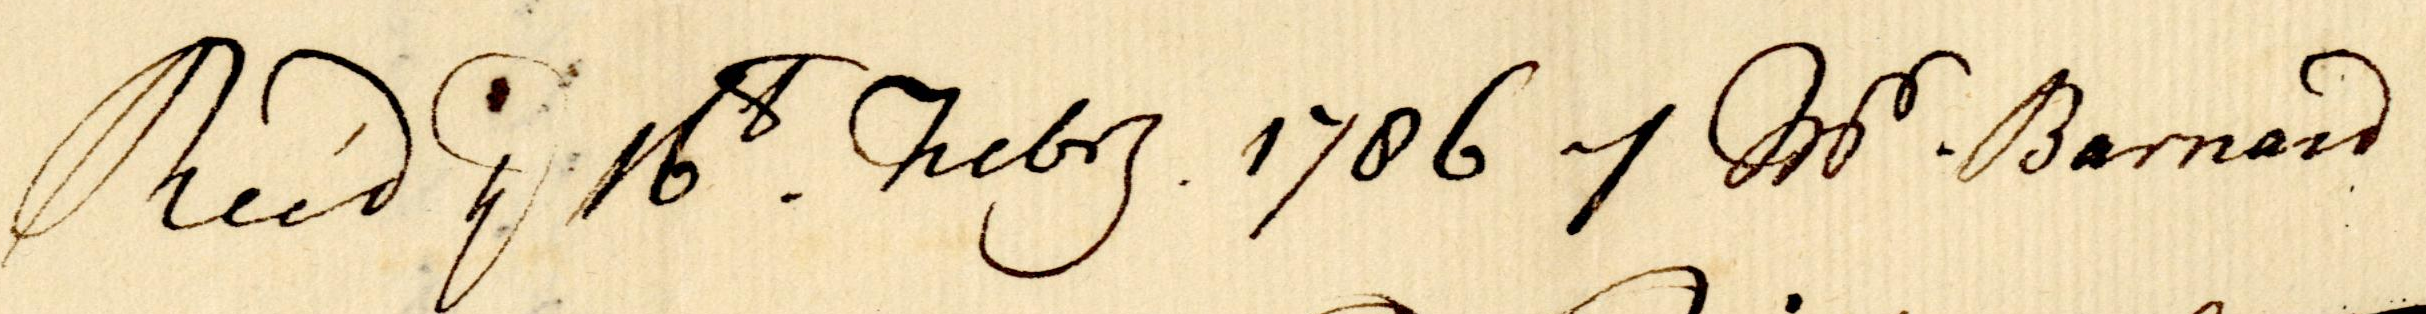Rec^d y^e 16^th Feby. 1786 of M^r. Barnard
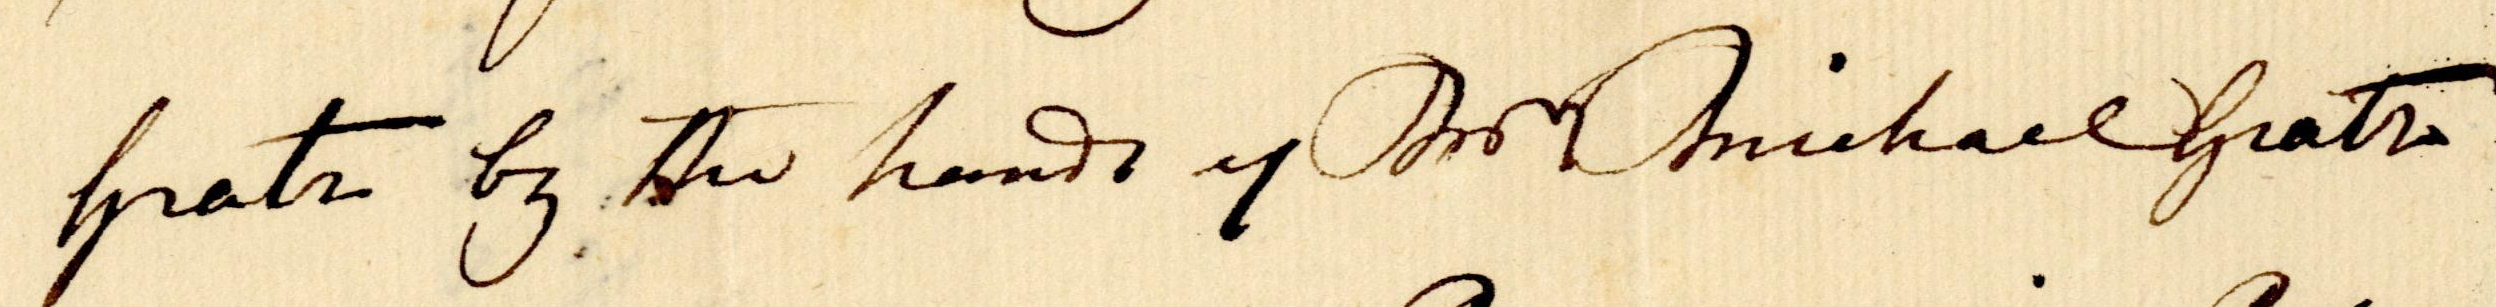Gratz by the hands of M^r Michael Gratz
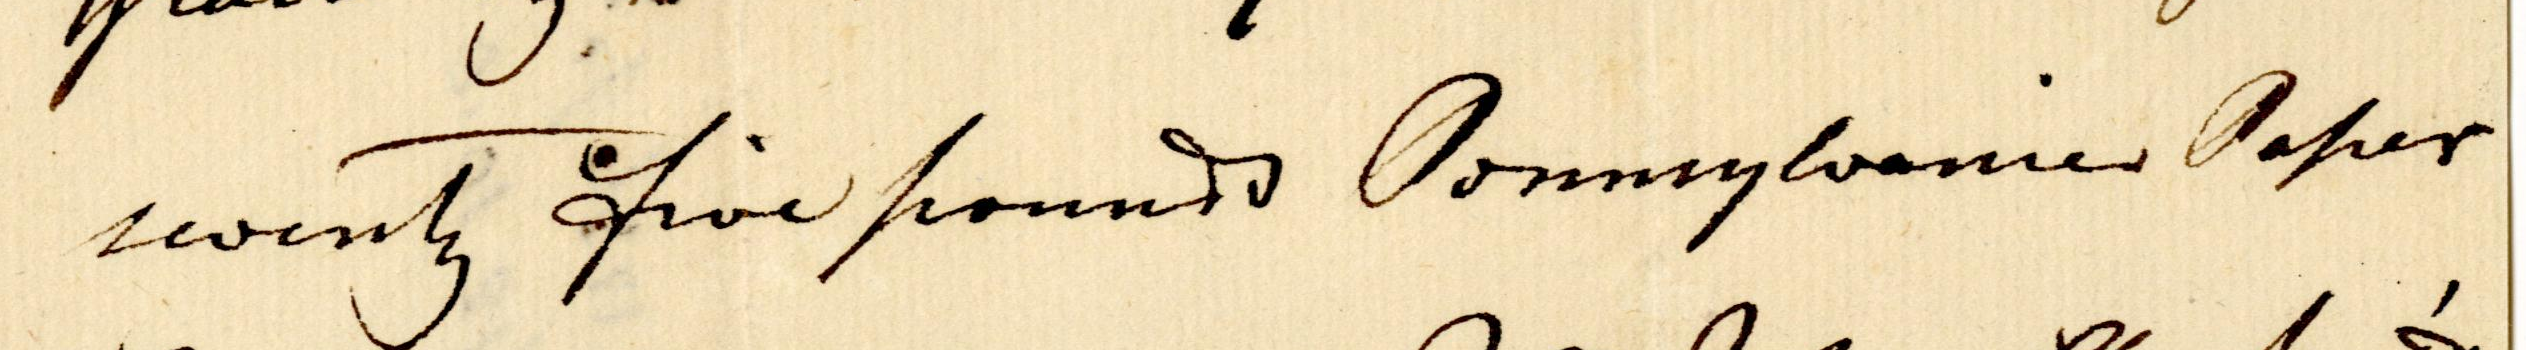seventy five pounds Pennsylvania Paper
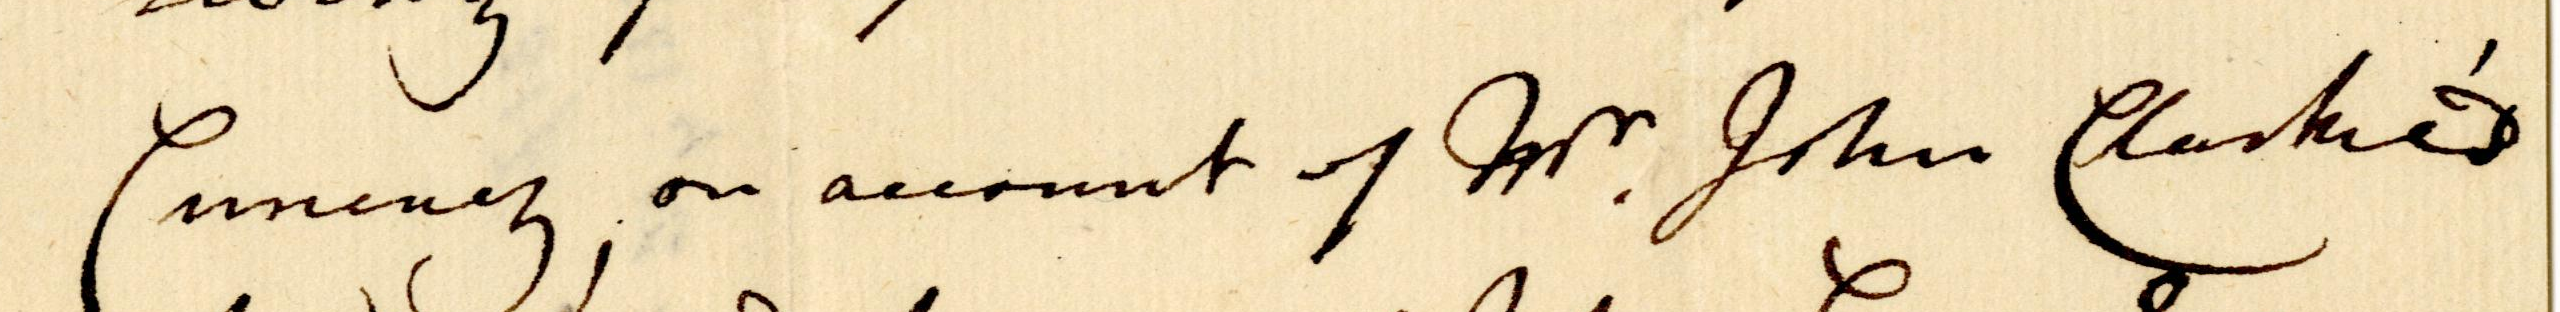currency on Account of M^r John Clarke's
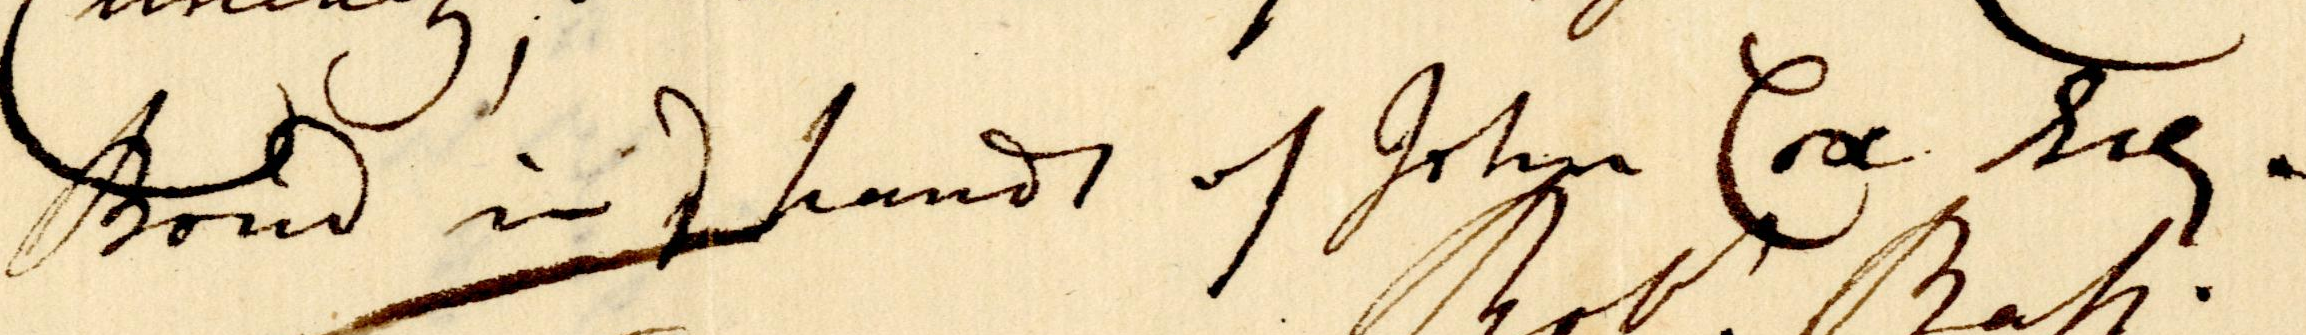Bond in hands of John Cox Esq.
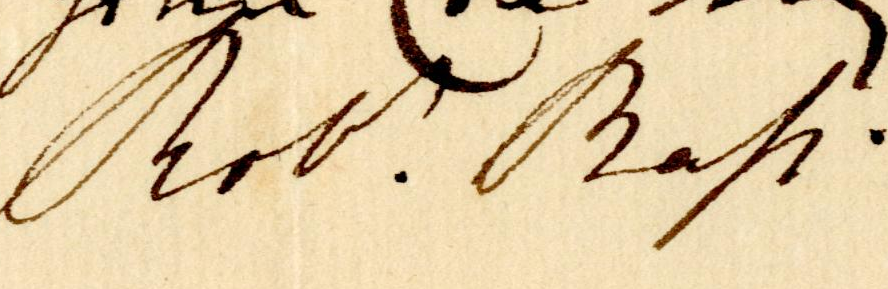Rob^t. Base
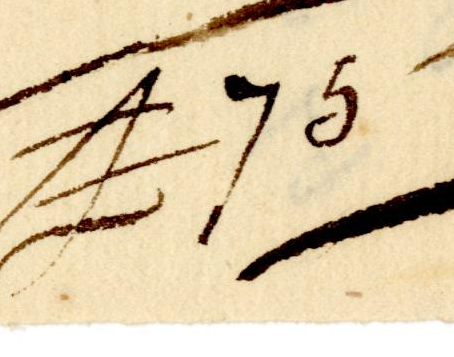£75
